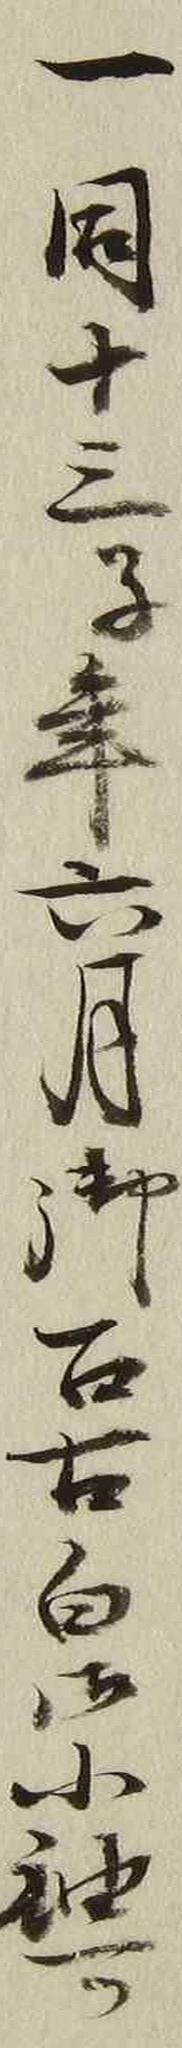一同十三子年六月御召古白御小袖一ツ
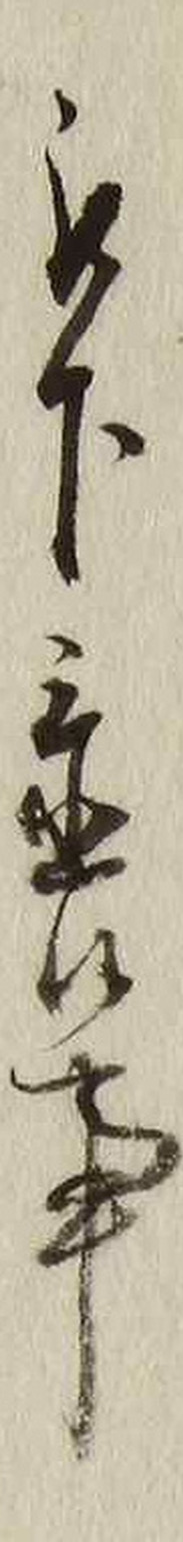被下置候事
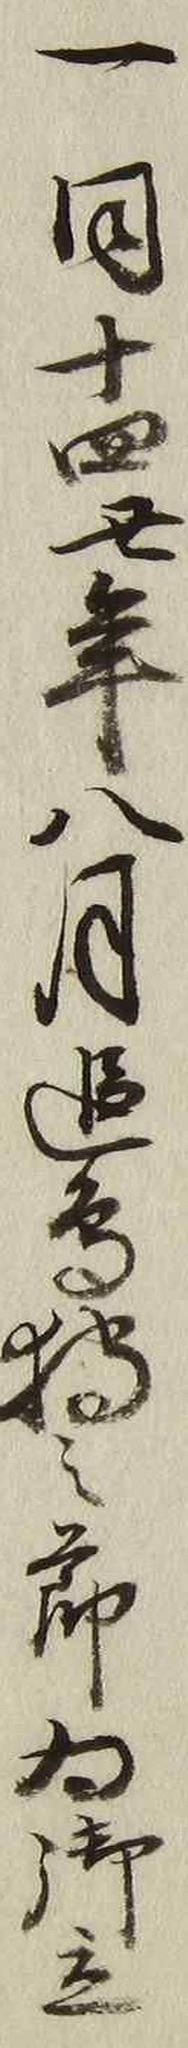一同十四丑年八月追鳥狩之節為御立
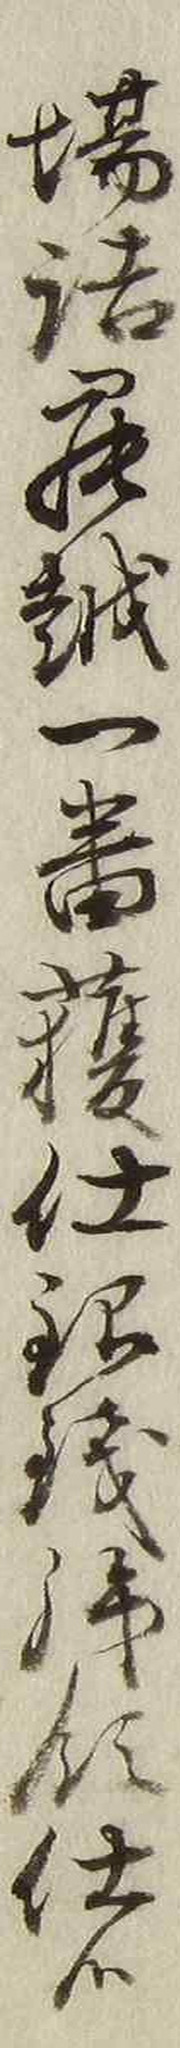場詰罷越一番獲仕銀銭拝領仕候
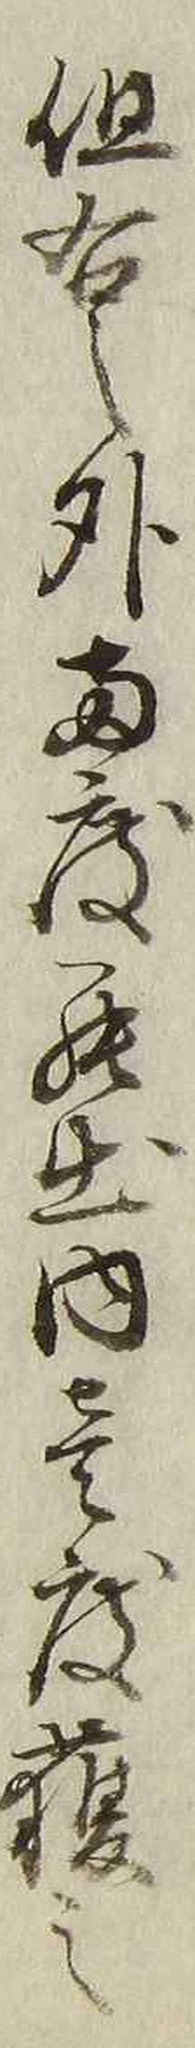但右之外両度罷出内壱度獲之
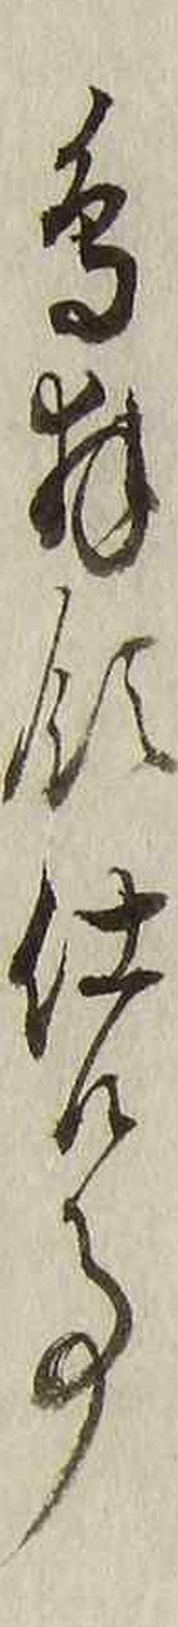鳥拝領仕候事
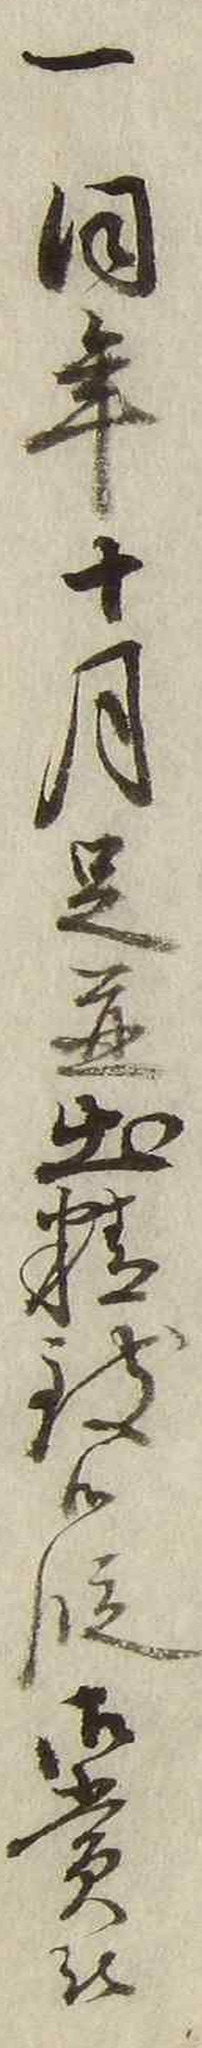一同年十月足並出精致候段御賞被

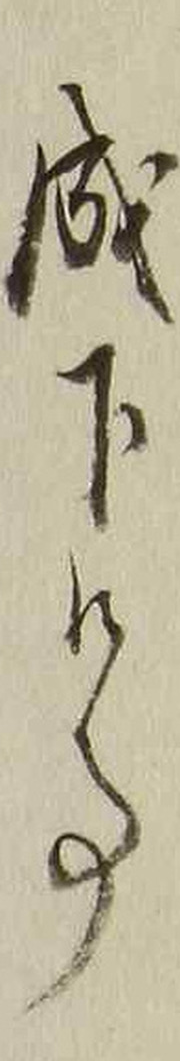成下候事
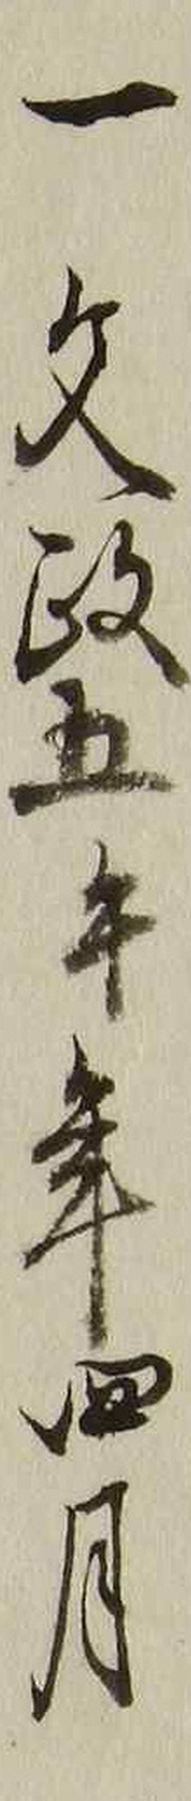一文政五午年四月
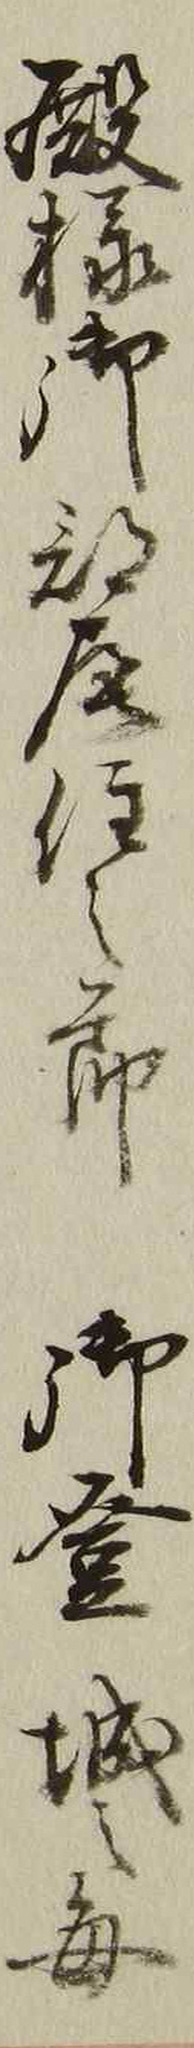殿様御部屋住之節御登城之毎
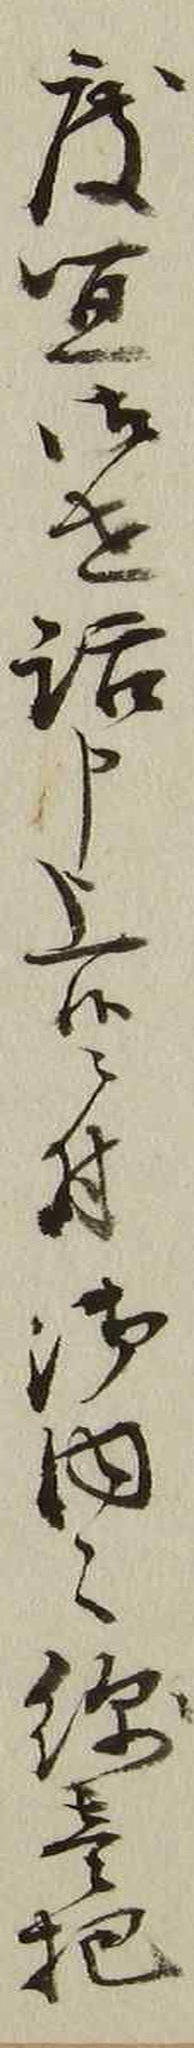度宜御世話申上候ニ付御内々綿壱把
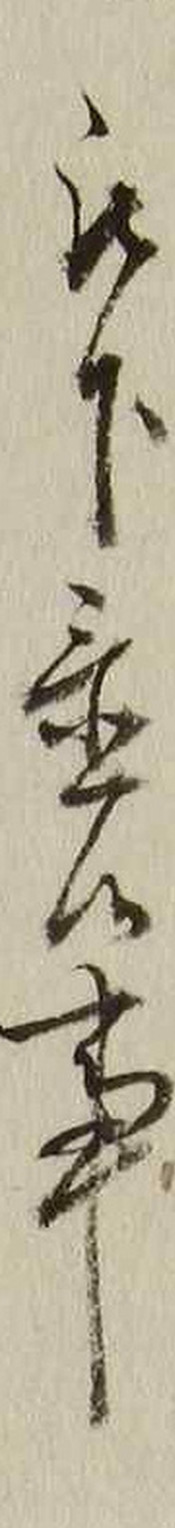被下置候事
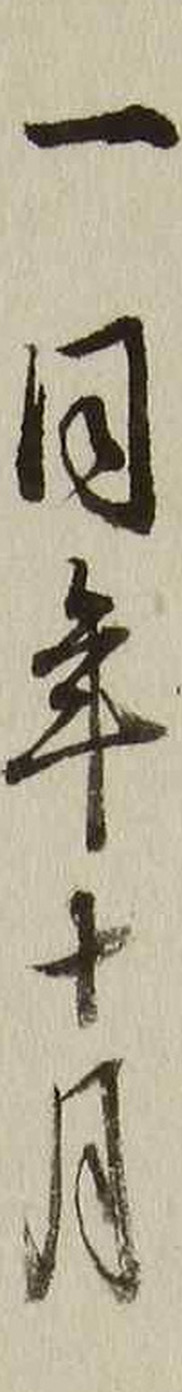一同年十月
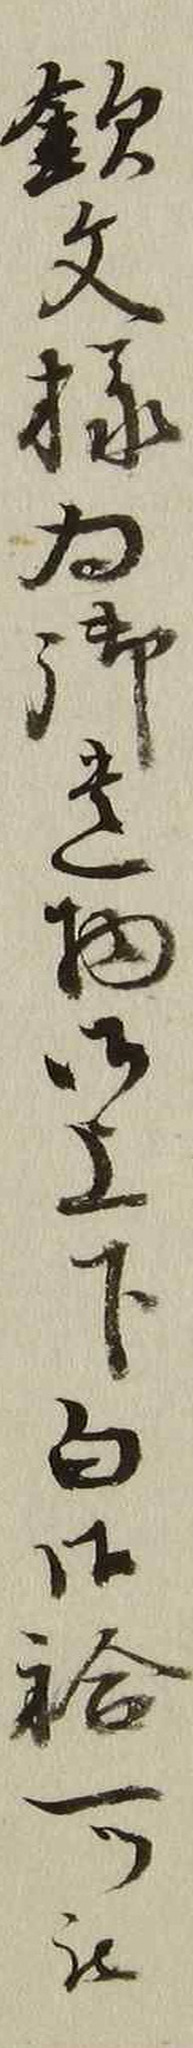欽文様為御遺物御上下白御袷一ツ被
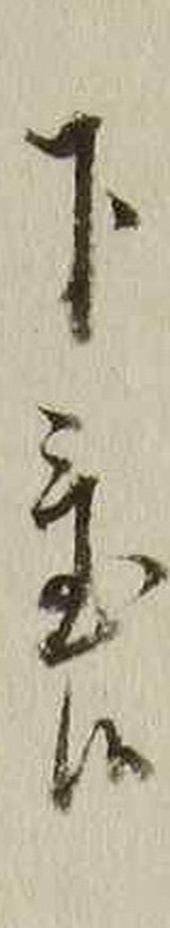下置候
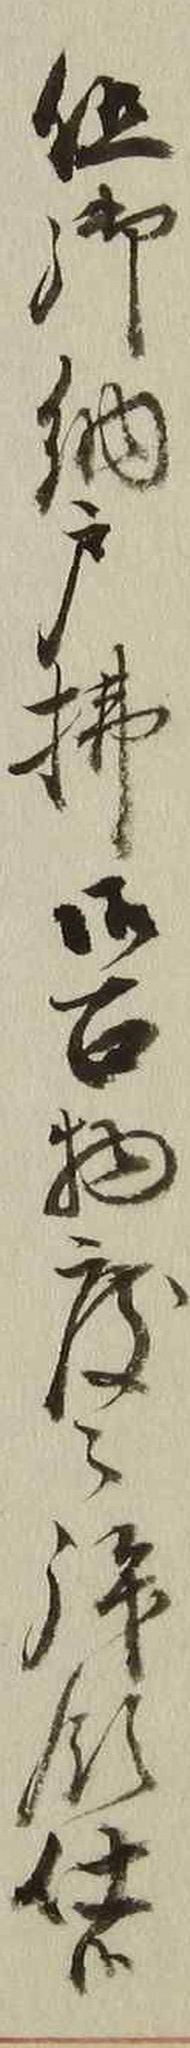但御納戸払御召物度々拝領仕候
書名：諸士系譜　巻之36　は之部4
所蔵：会津若松市立会津図書館
